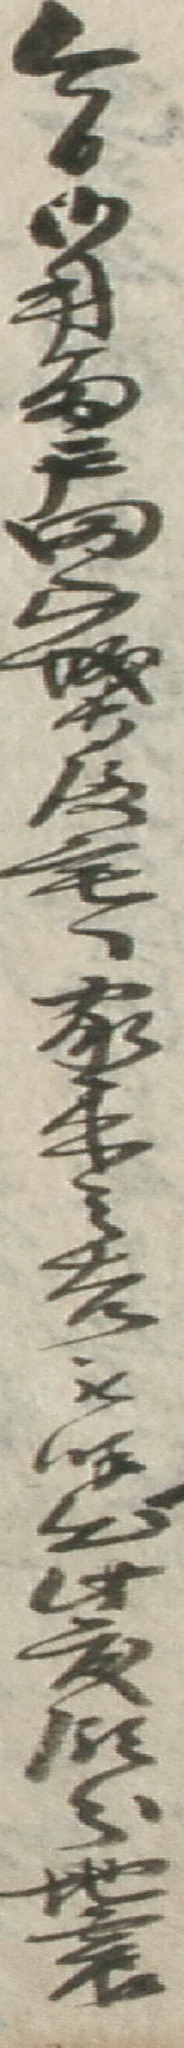今日御用番戸田山城守殿宅へ家来之者被呼出此度領分地震
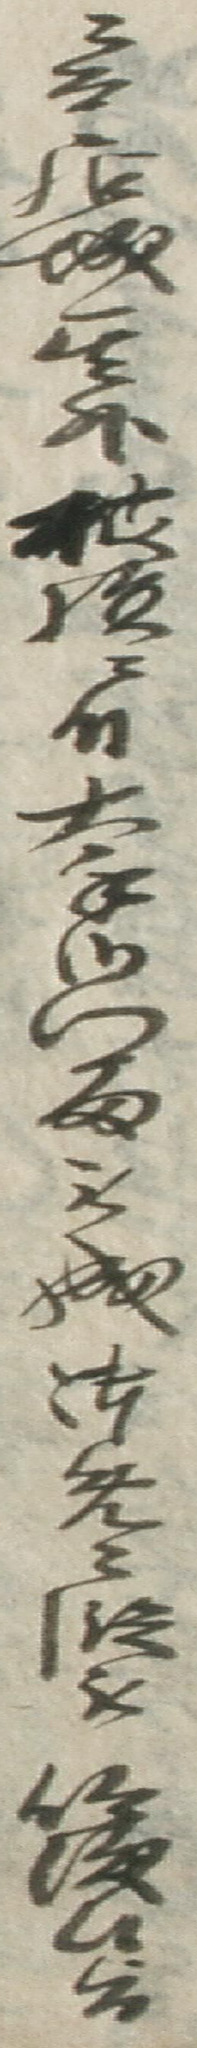二而居城其外破損二付大手御門番被成御免候段被仰渡候旨
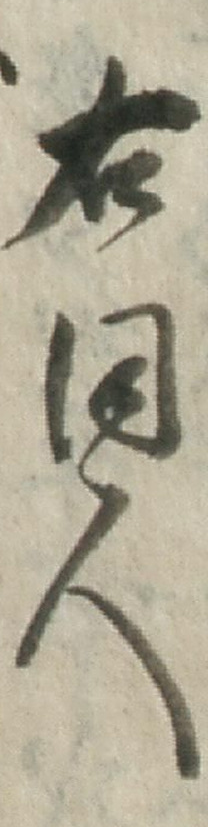右同人
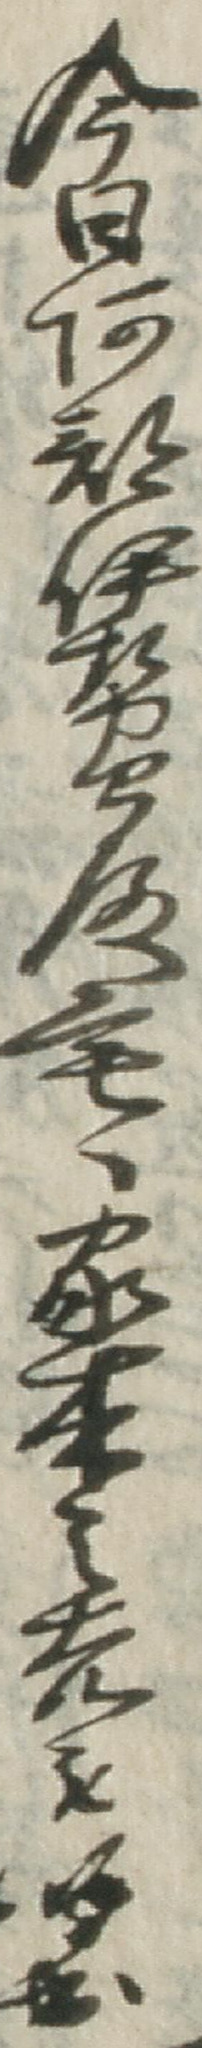今日阿部伊勢守殿宅へ家来之者被呼出
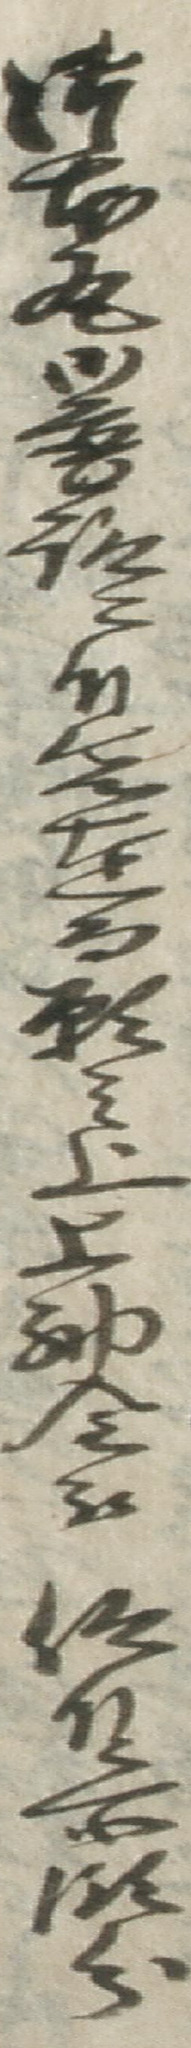御本丸御普請二付先達而願之上上納金被仰付候所領分
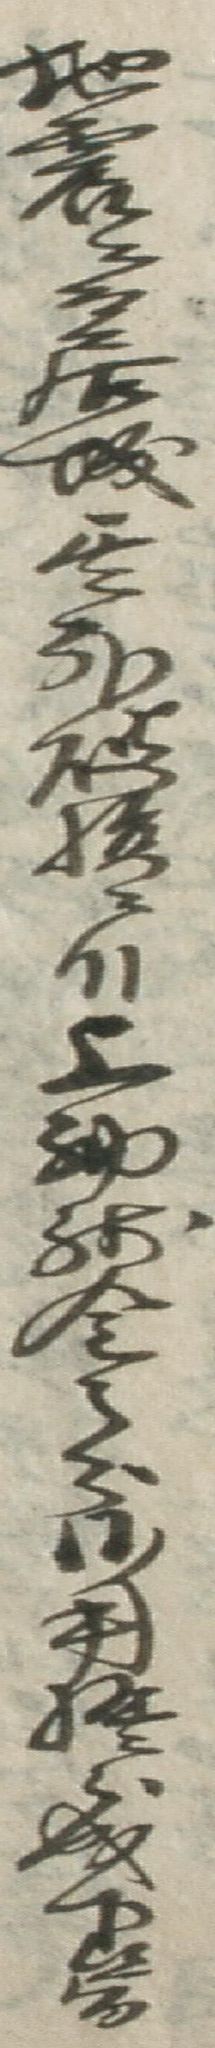地震二而居城其外破損二付上納献金之分御用捨二被成下候旨
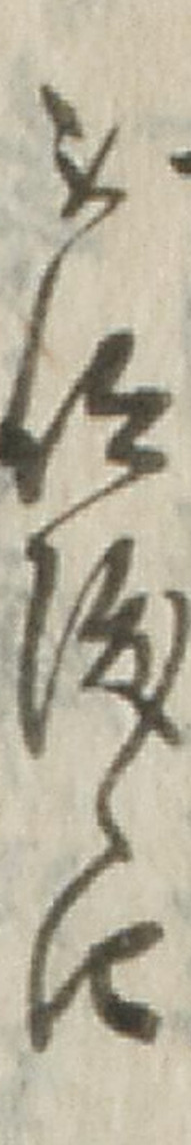被仰渡候由
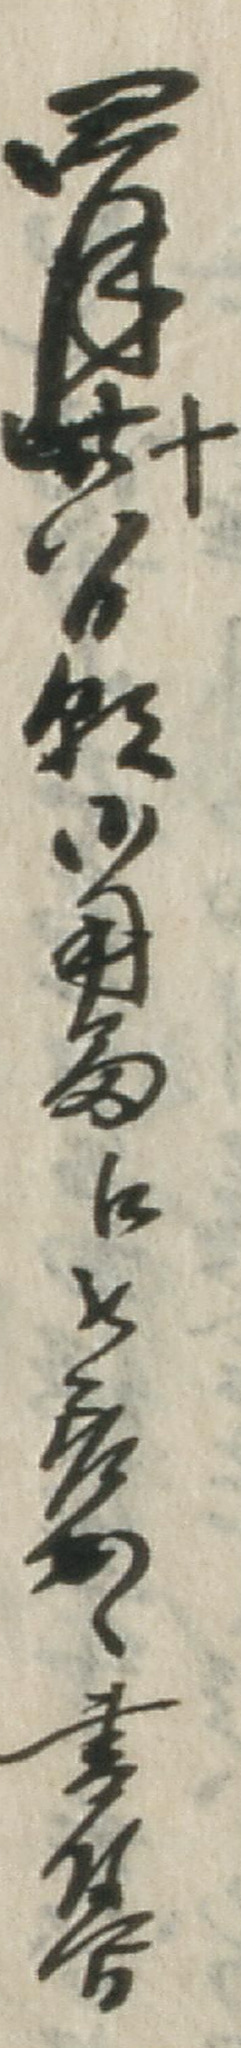四月十八日朝御用番江被差出候書付写
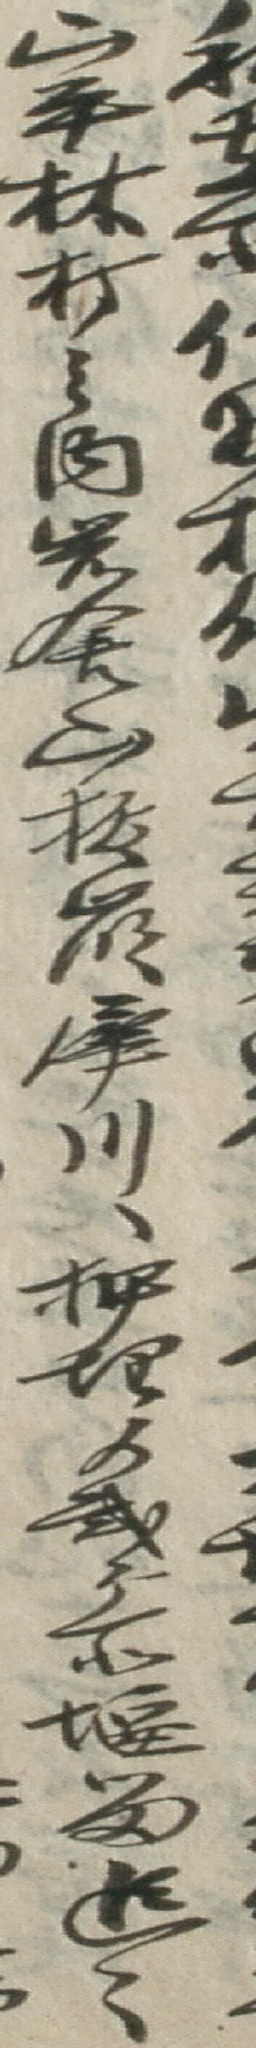山平林村之内岩倉山抜崩犀川へ押埋メ弐ヶ所堰留追々
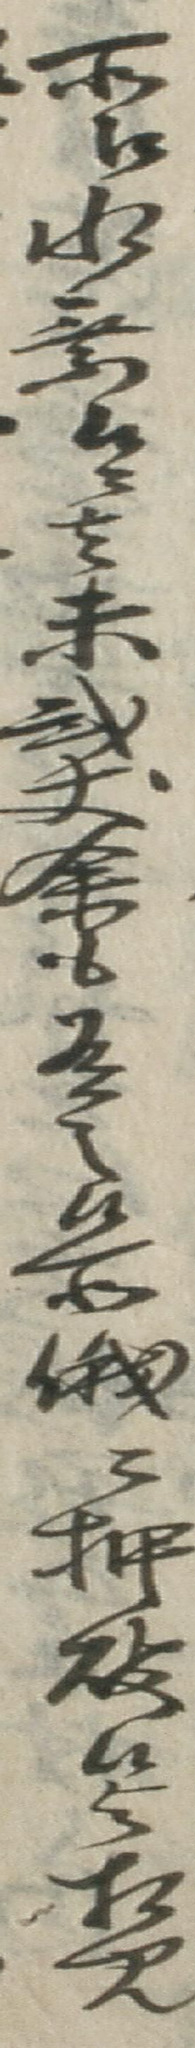所江水乗候二者は未弐丈余も有之候所俄二押破候と相見
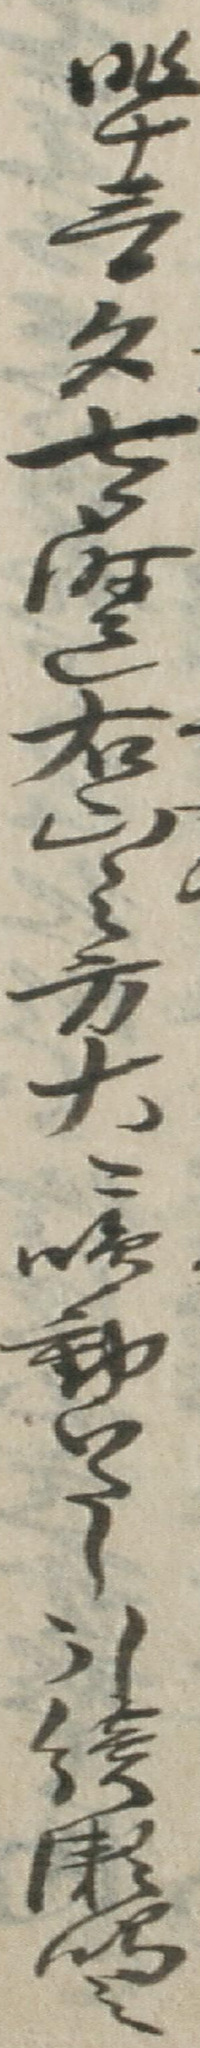夕七ツ時過右山之方大二鳴動いたし引続瀬鳴之
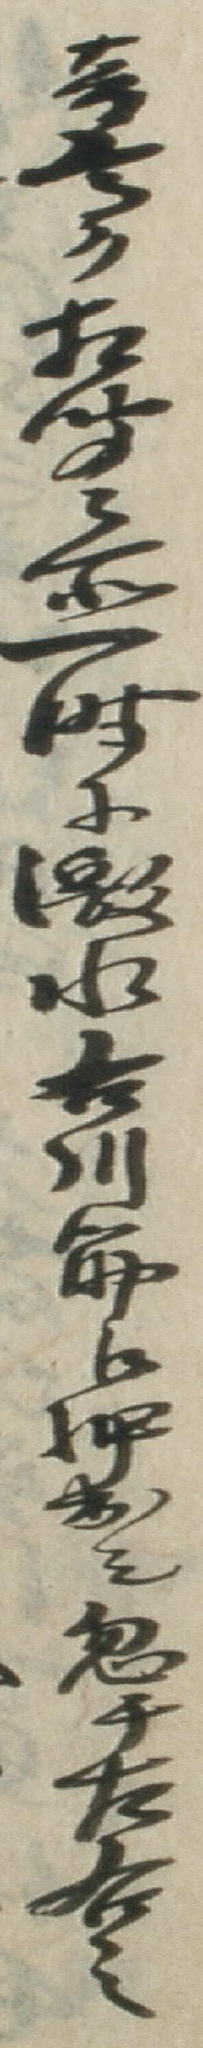高ク相聞候所一時二激水右川筋江押出ㇱ忽チ左右之
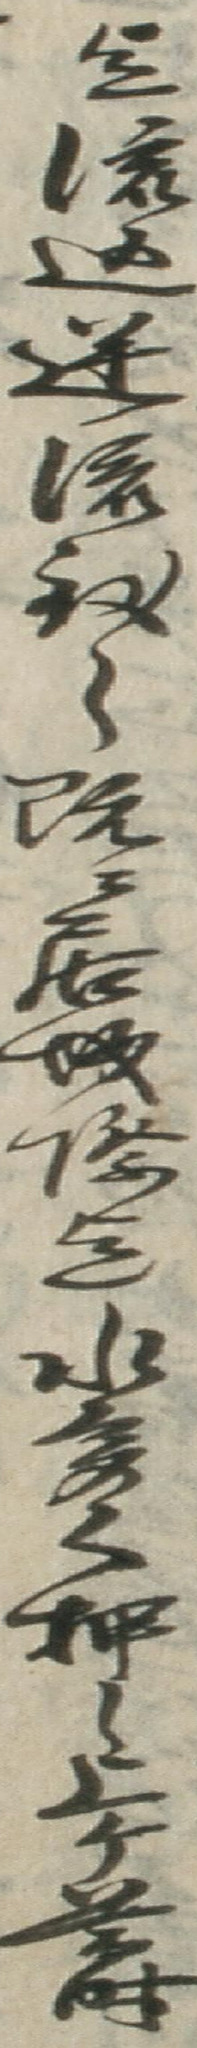迄流込逆流致し既二居城際迄水多く押し上ヶ暮時
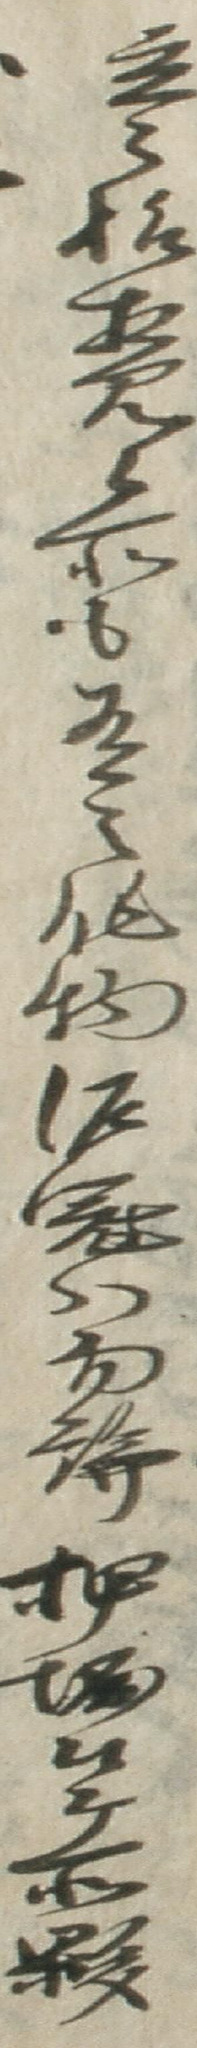立候様相見候所も所有之作物泥冠ハ勿論押堀候ヶ所夥
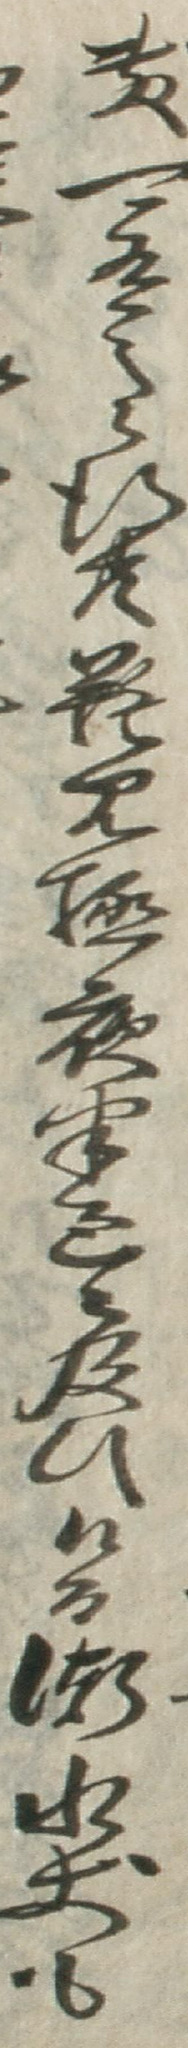敷可有之候得共難見極夜半過二及候而漸水丈も
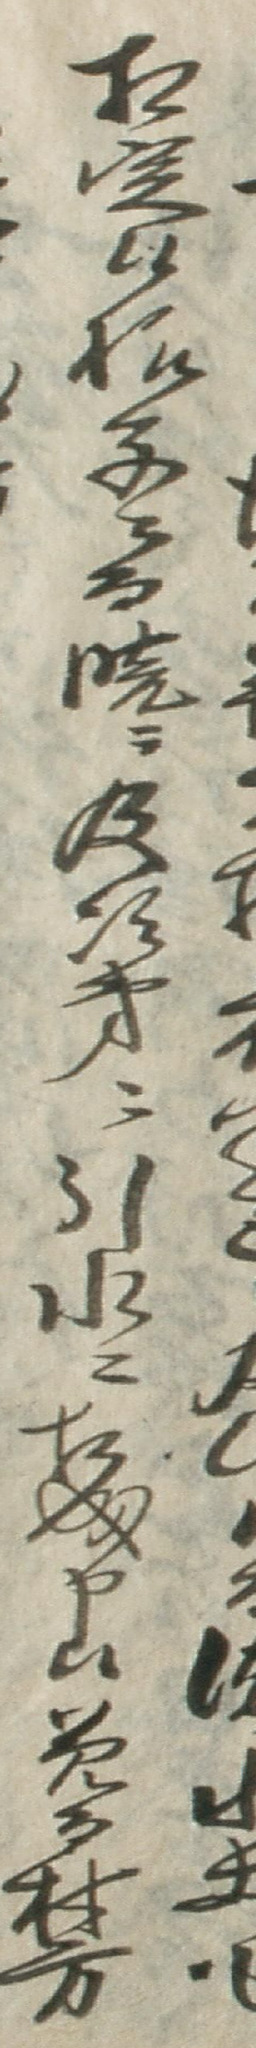相定候様子二而暁二及次第二引水二相成申候
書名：信濃國地震實録記
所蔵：東京大学地震研究所図書室 Earthquake Research Institute Library, The University of Tokyo, JAPAN
